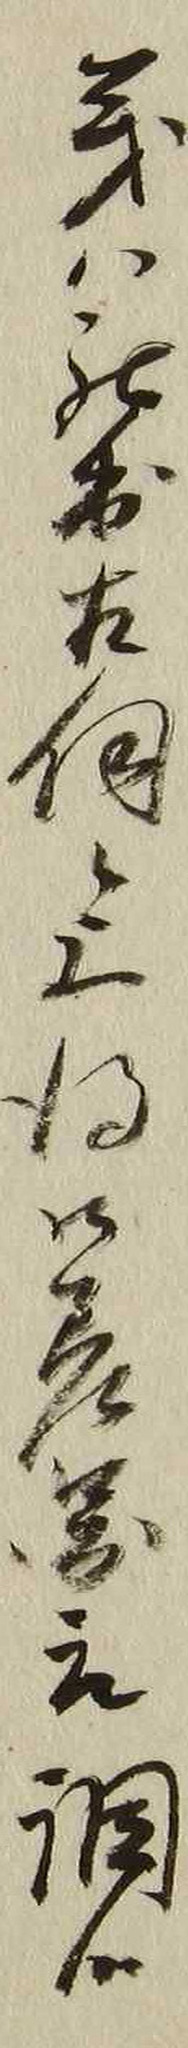儀ハ罷出相伺候上得御差図取調候
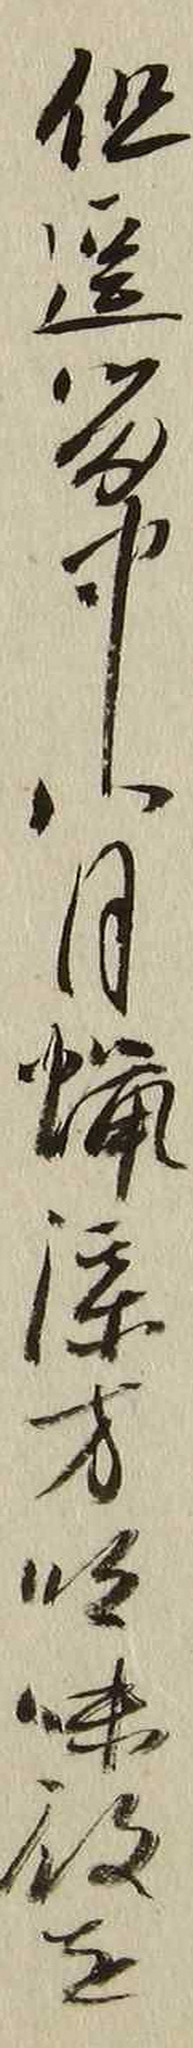但逗留中八月蝋添方吟味役を
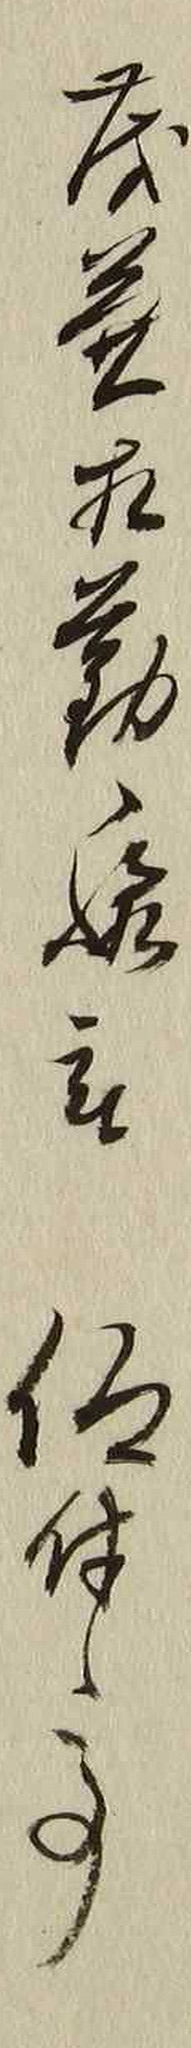も益相勤候始被仰付候事
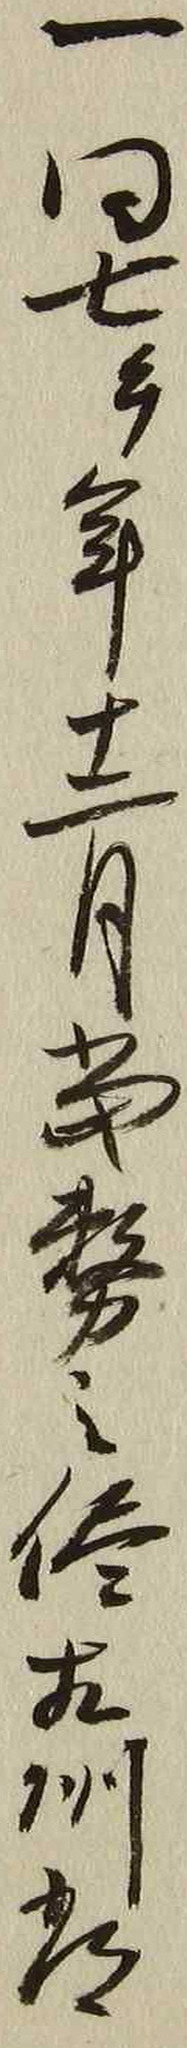一同七午年十二月当務之儘相州常
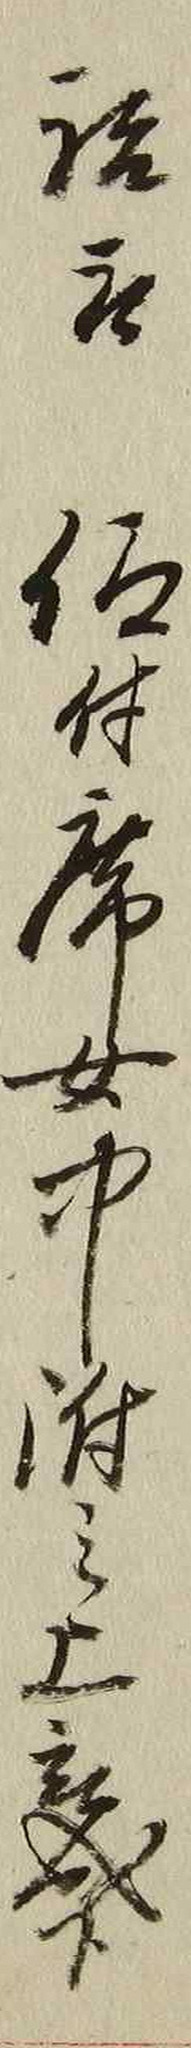詰被仰付席女中附之上被成下
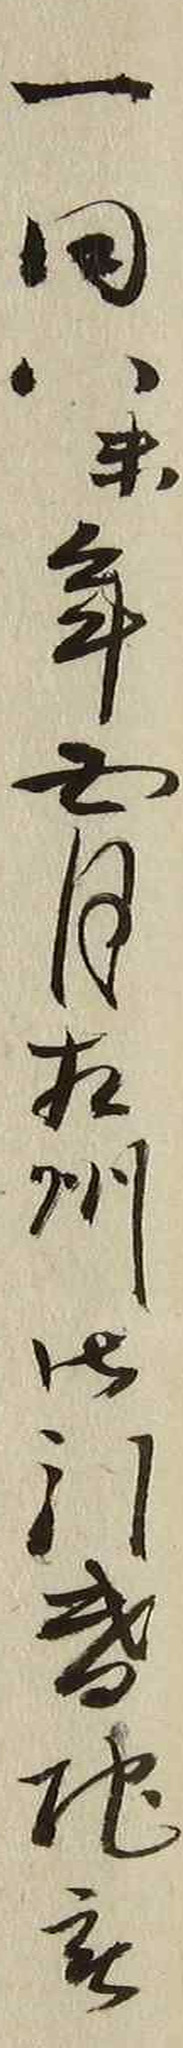一同八未年五月相州此引替地被
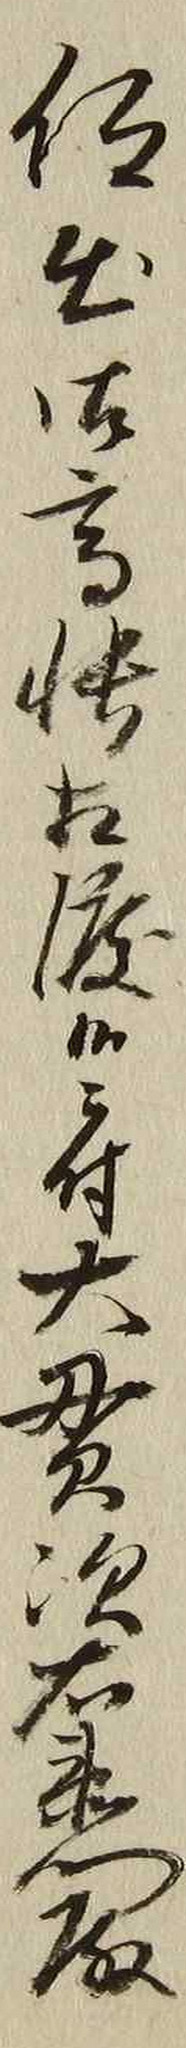仰出御高帳相渡候ニ付大貫次右衛門殿
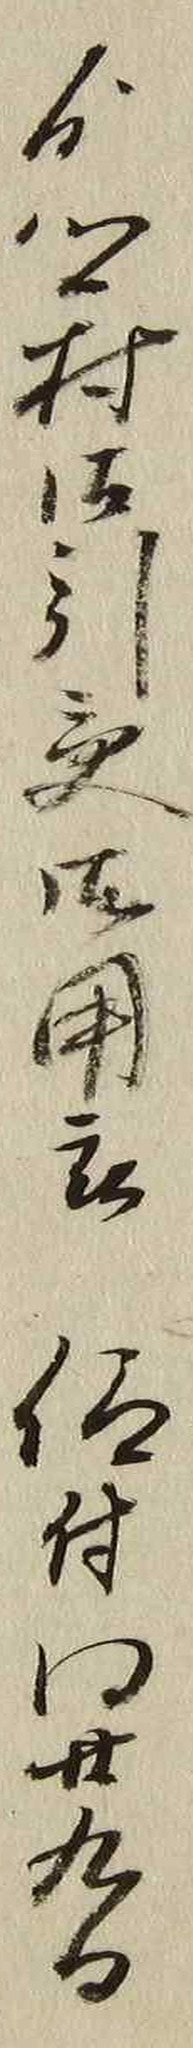ゟ郷村御引受御用被仰付同廿九日
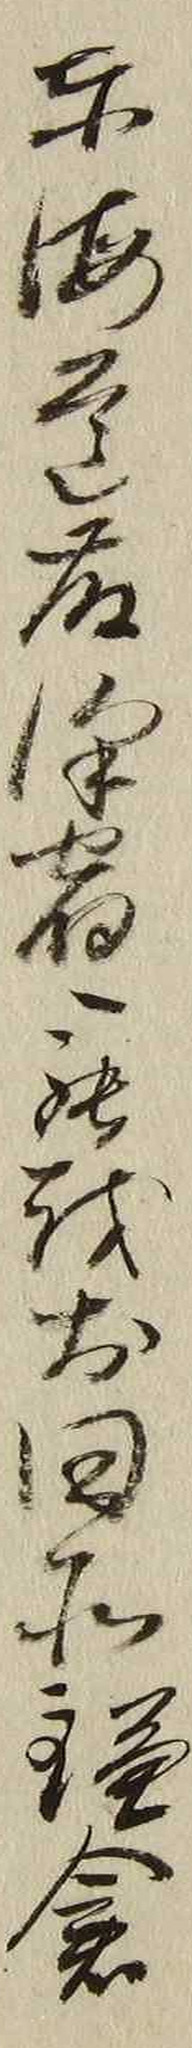東海道藤沢宿へ罷越於同所鎌倉
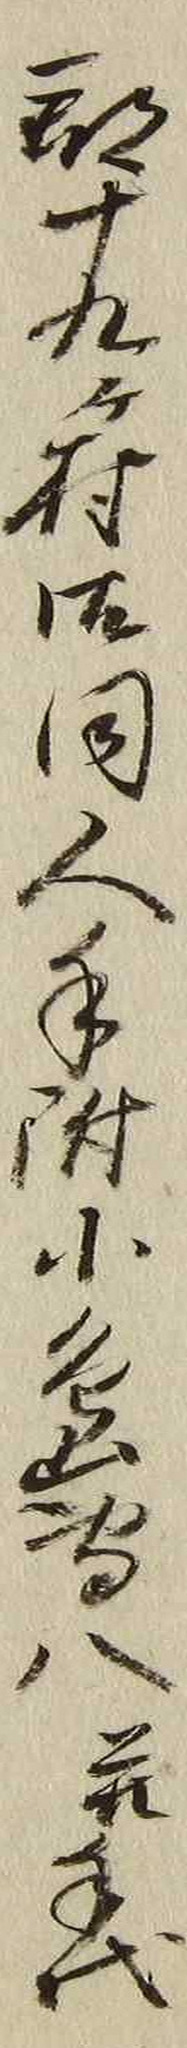郡十九ヶ村御同人手附小島専八并手代
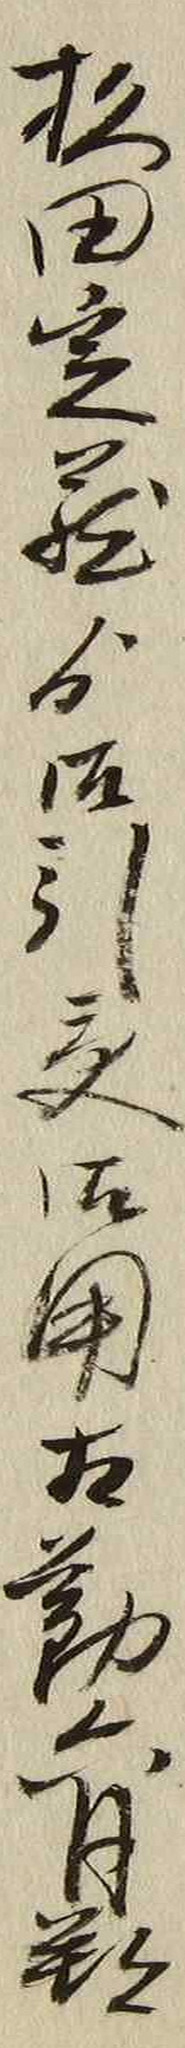杉田定蔵ゟ御引受御用相勤六月朔
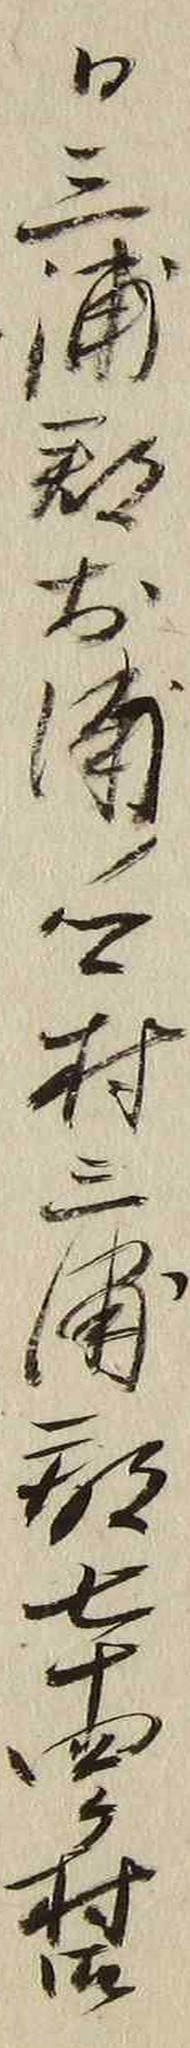日三浦郡於浦ノ郷村三浦郡七十四ヶ村御
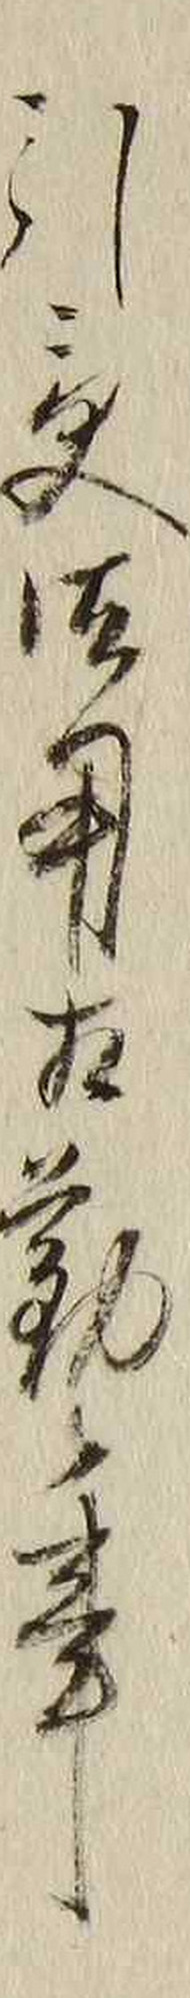引受御用相勤候事
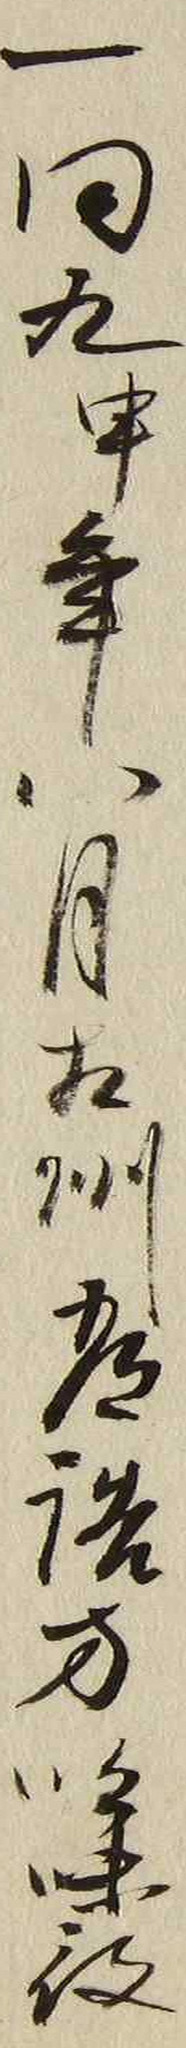一同九申年八月相州常詰方吟味役
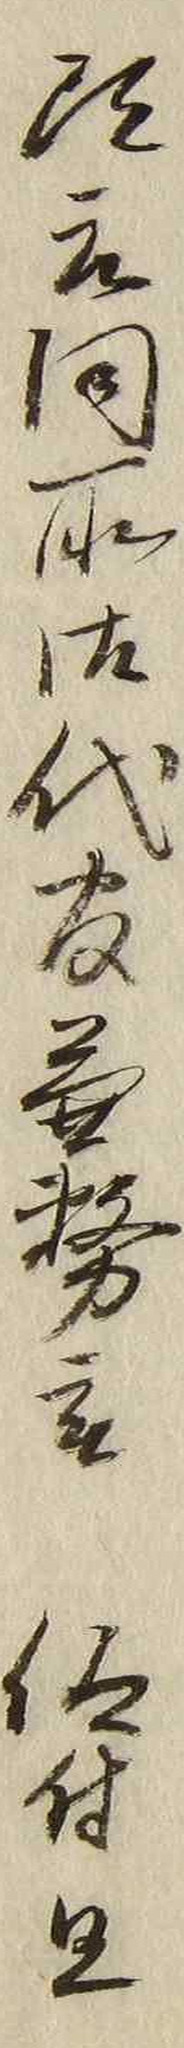頭取同所御代官兼務被仰付且

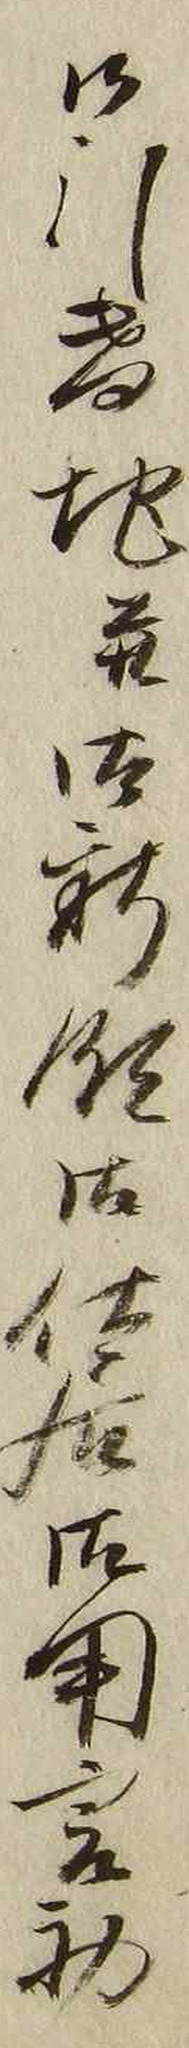御引替地并御新領御仕居御用最初
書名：諸士系譜　巻之352　す之部2
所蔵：会津若松市立会津図書館
